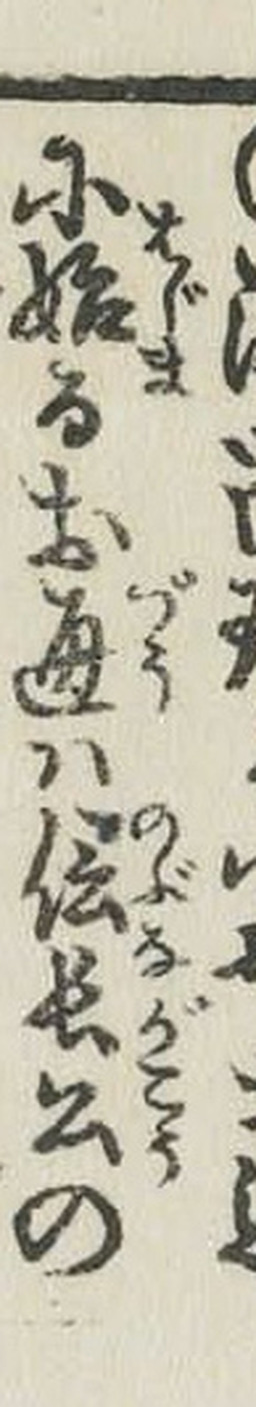に始るお通は信長公の
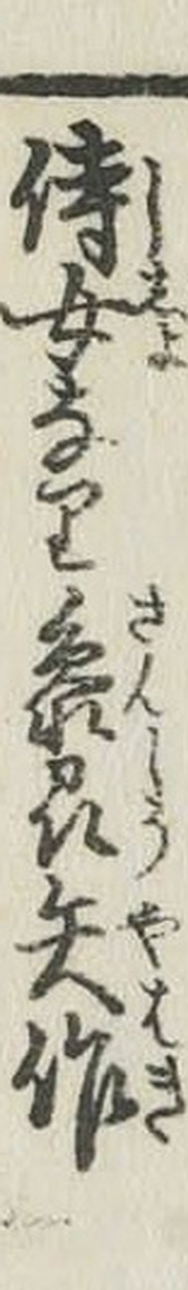侍女なり参州矢作
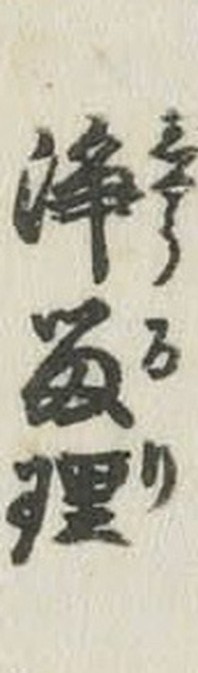浄留理
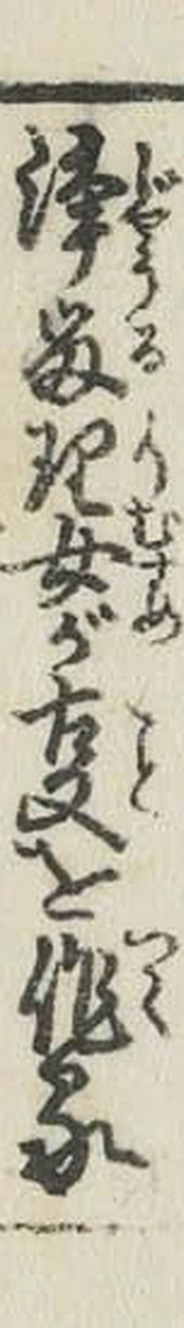浄留理女が事を作る
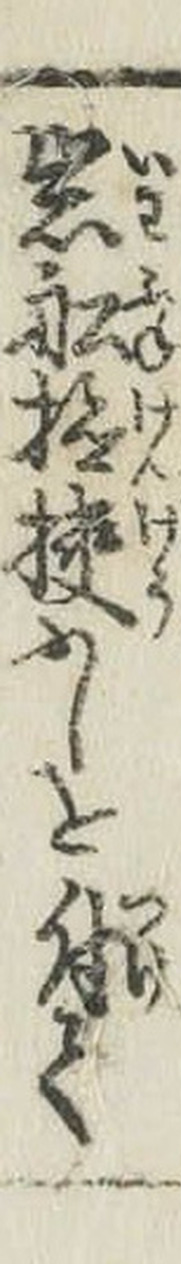岩船検校ふしを付て
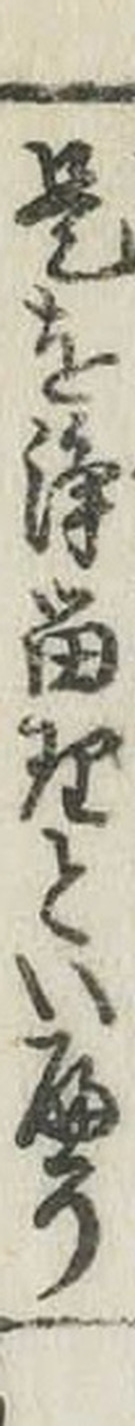是を浄留理といへり
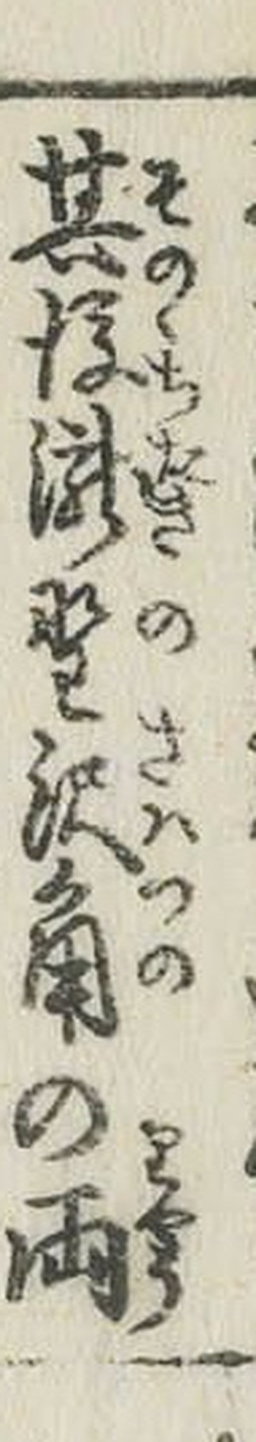其後瀧野沢角の両
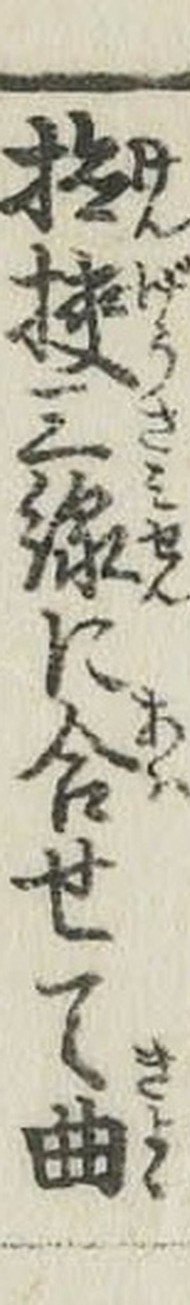検校三線に合せて曲
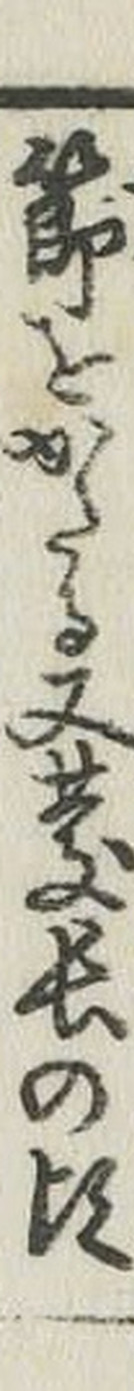節をかたる又慶長の頃
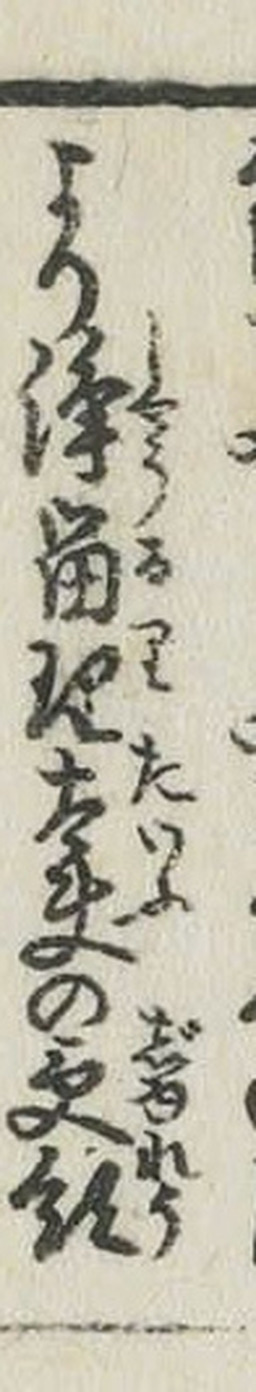より浄留理太夫の受領
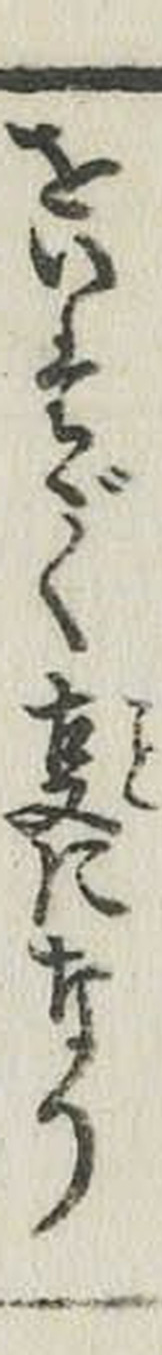をいたゞく事になり
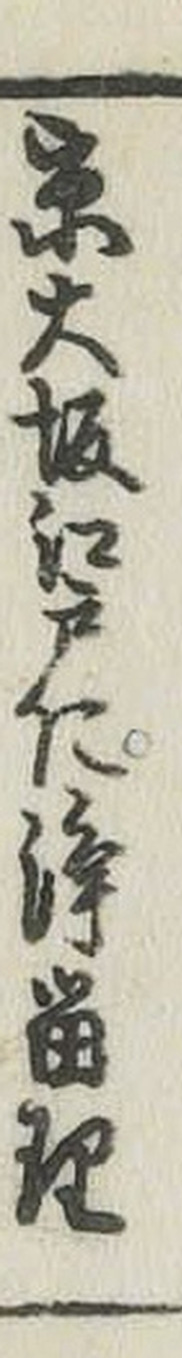京大阪江戸に浄留理
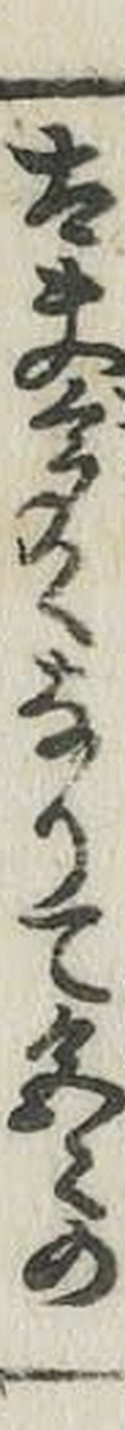太夫多くなりて色々の
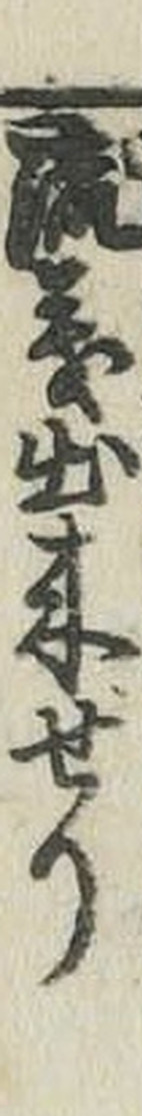流義出来せり

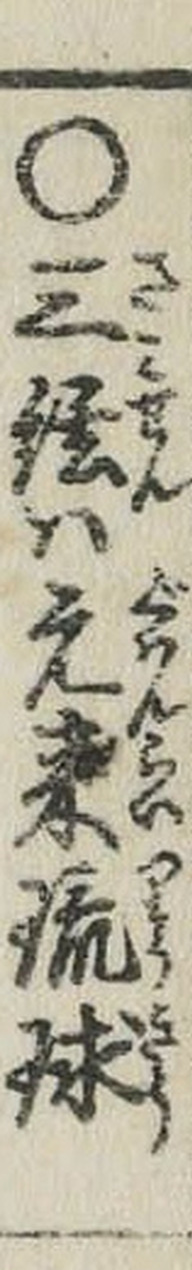○三絃は元来琉球
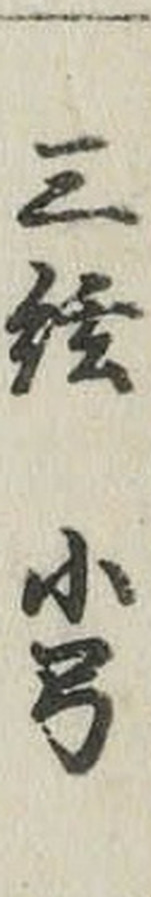三絃小弓
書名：増補頭書訓蒙図彙大成 10巻 10:巻之21
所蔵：東京学芸大学教育コンテンツアーカイブ
